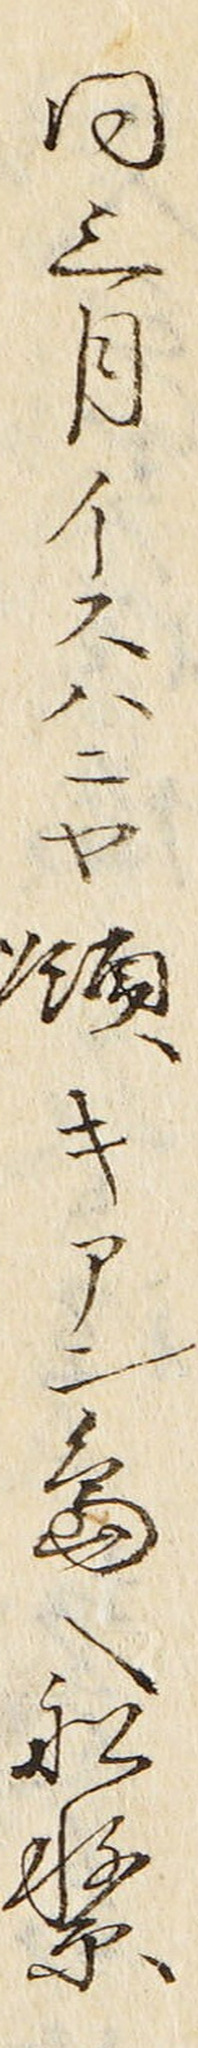同三月イスハニヤ領キアン島へ船繋
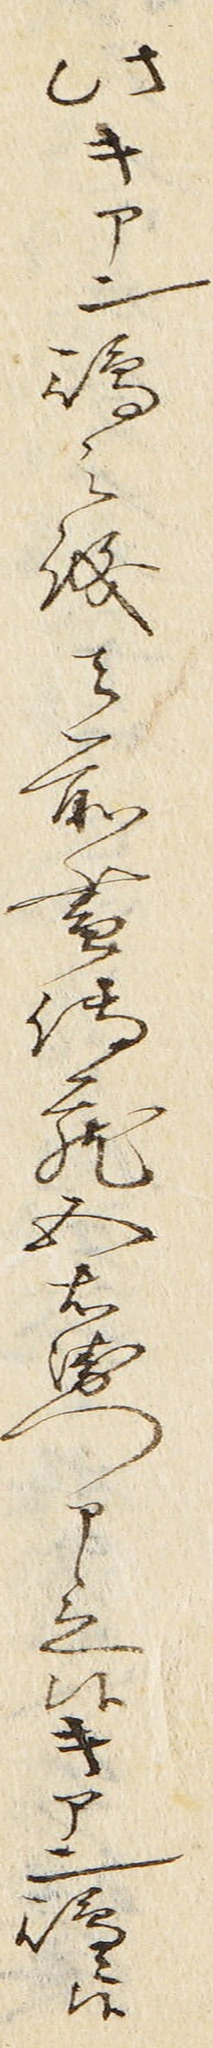此キアン嶋之儀は前暮伝蔵五右衛門申立候キアン嶋に候
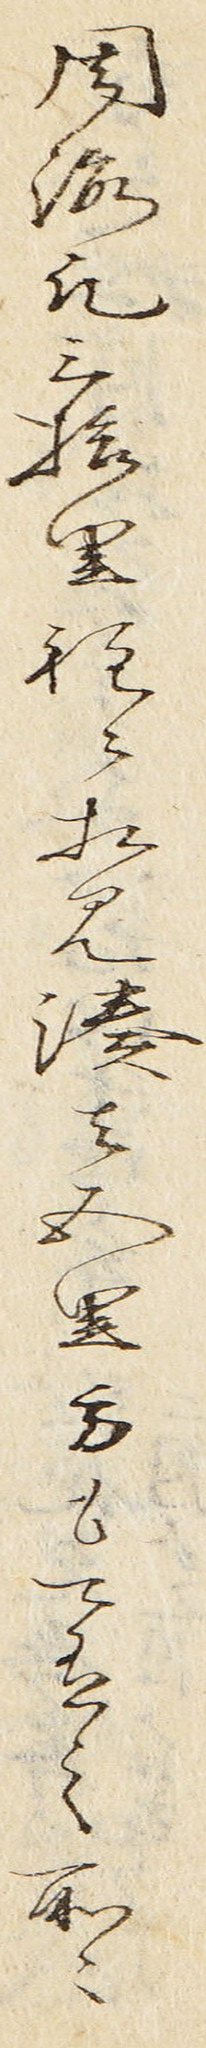周海凡三拾里程に相見湊は五里方も可有之所々
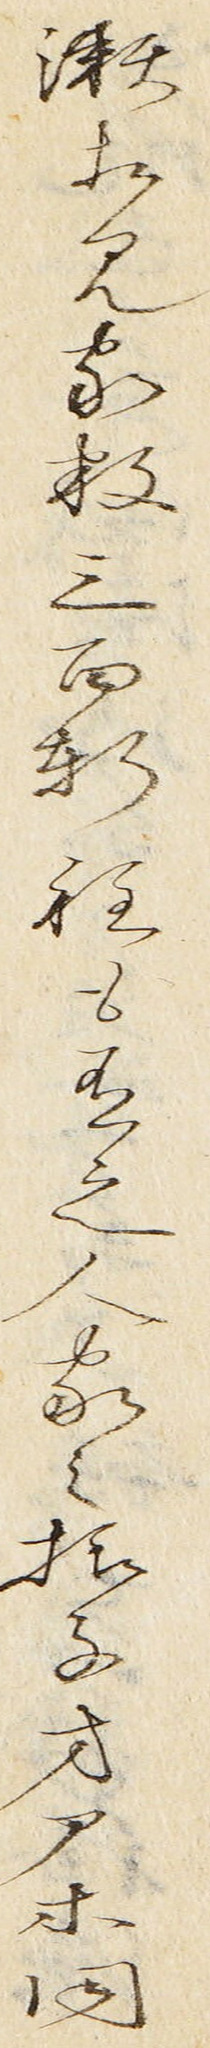瀬相見家数三百軒程も有之人家之様子オアホ同
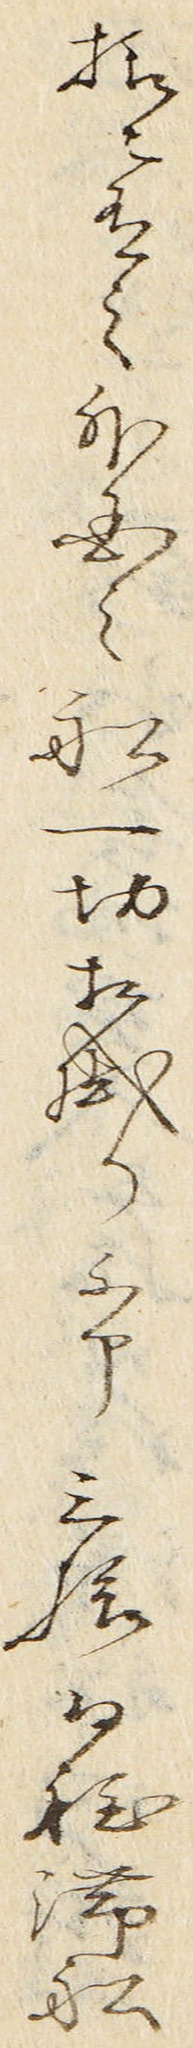様に有之外国之船一切相掛り不申三拾日程滞船
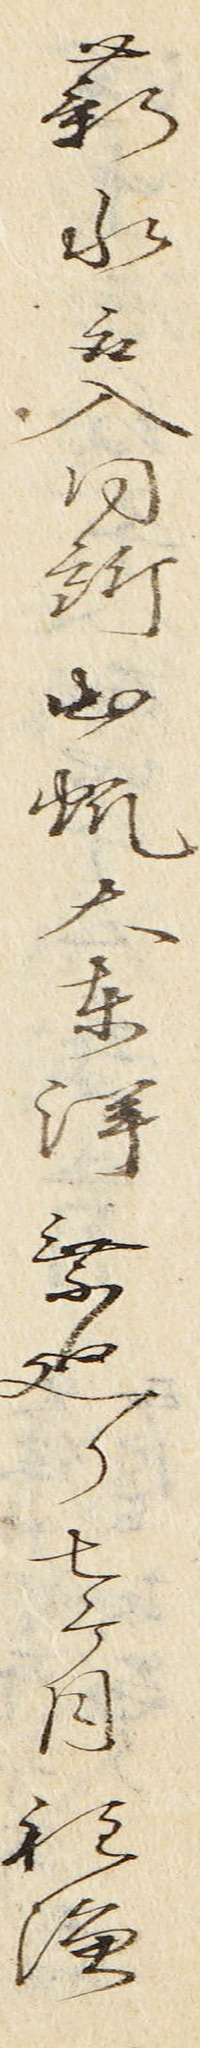薪水取入同所出帆大東洋乗廻り七ヶ月程漁
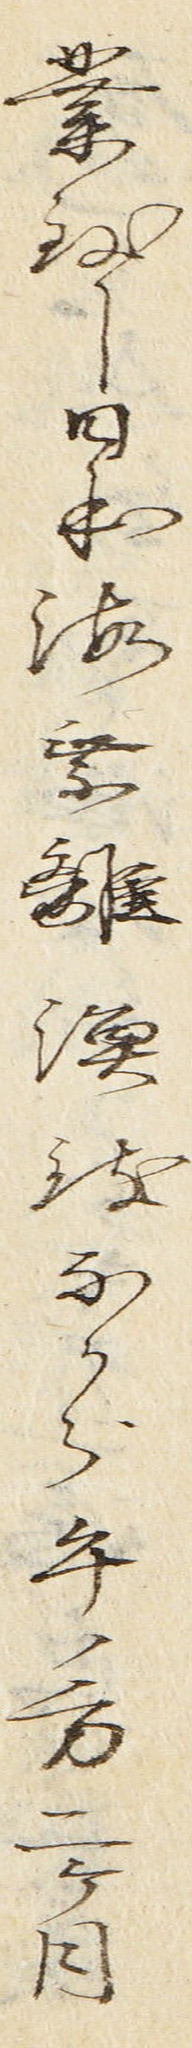業致し日本海乗離漁致なから午ノ方二ヶ月
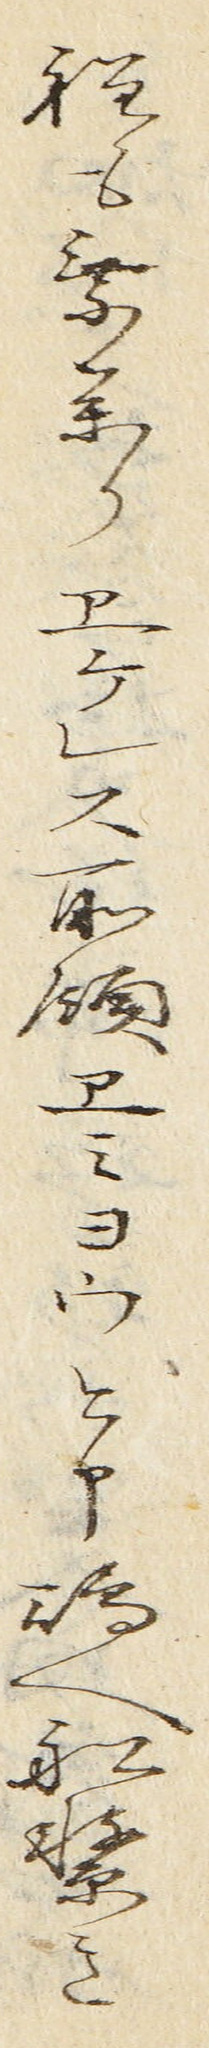程も乗参りエケレス所領エミヨウと申嶋へ船繋き
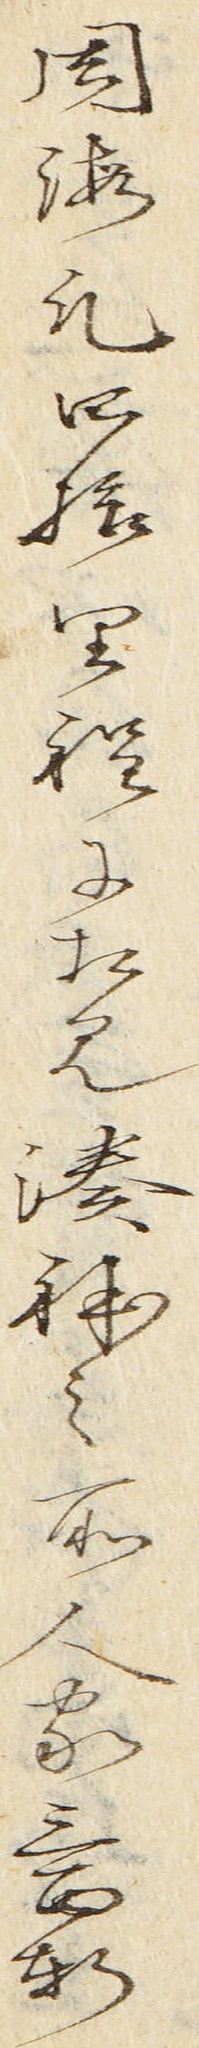周海凡四拾里程に相見湊躰之所人家三百軒

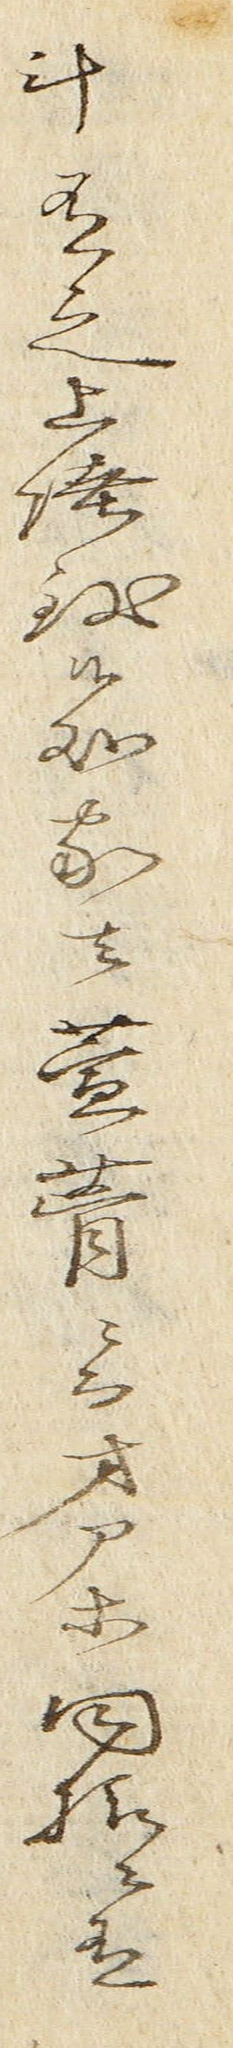計有之上陸致候処家は萱葺に而オアホ同様に有
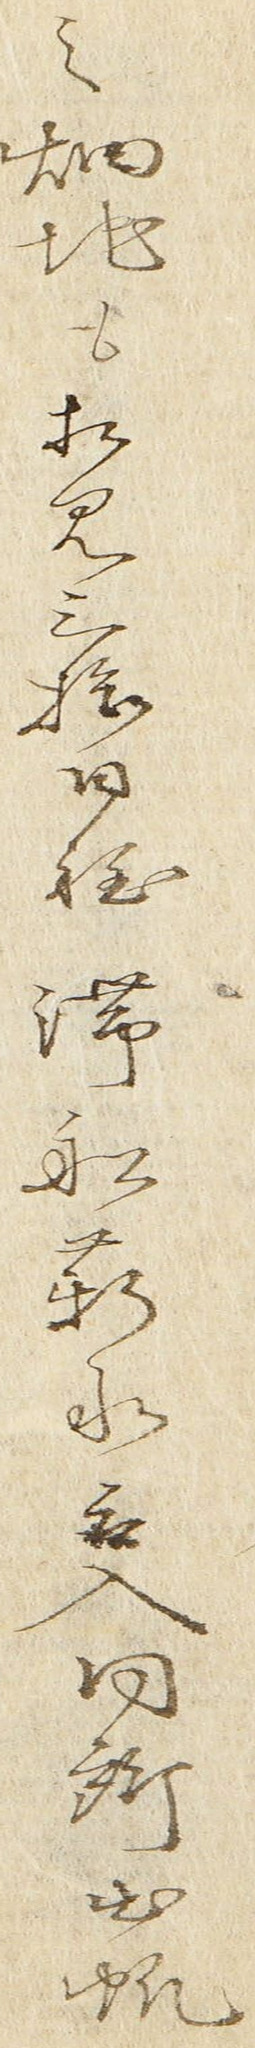之畑地も相見三拾日程滞船薪水取入同所出帆
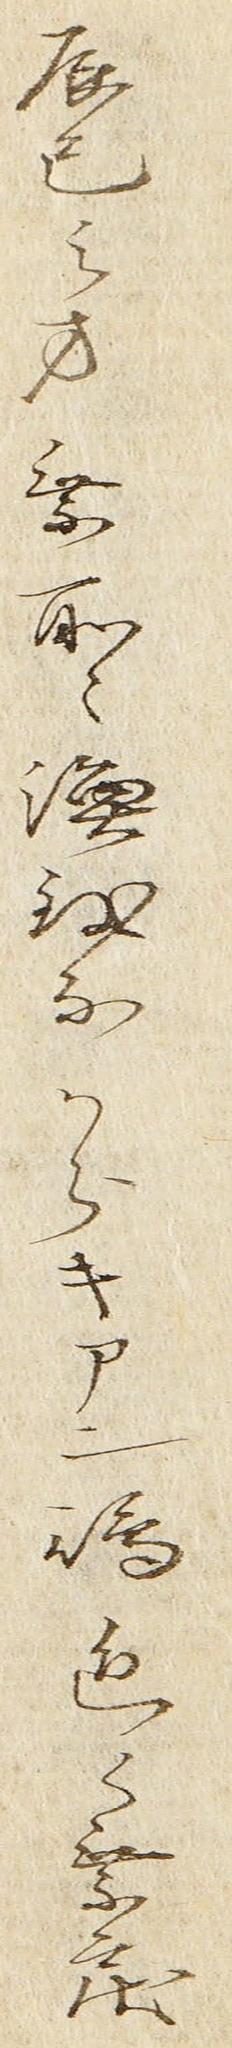辰巳之方乗所々漁致なからキアン嶋近く乗戻
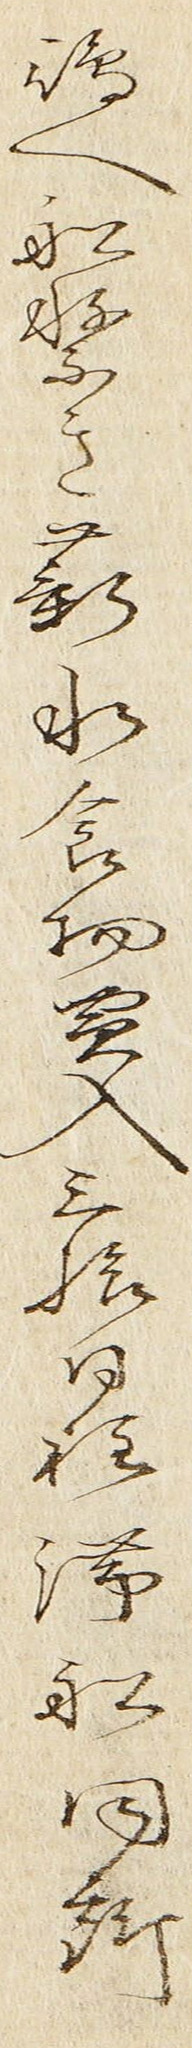嶋へ船繋薪水食物買入三拾日程滞船同所
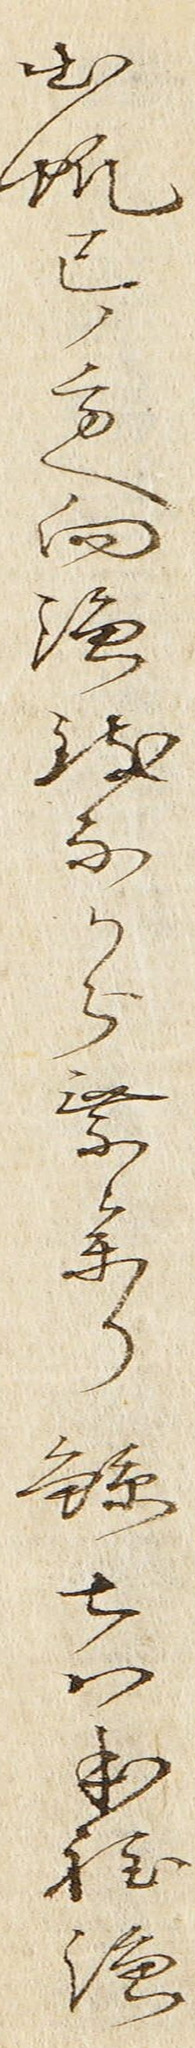出帆巳ノ方向漁致なから乗参鯨七八本程漁
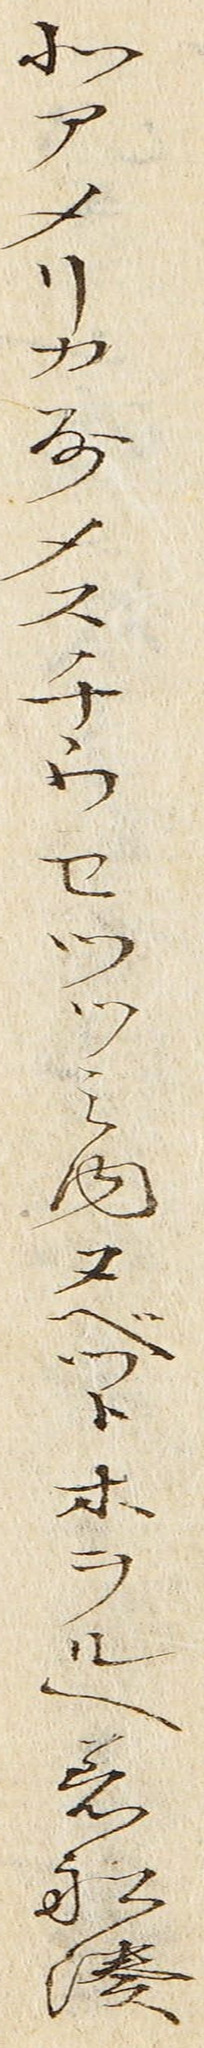北アメリカ州メスチウセツツ之内ヌベツトホヲルへ着船湊
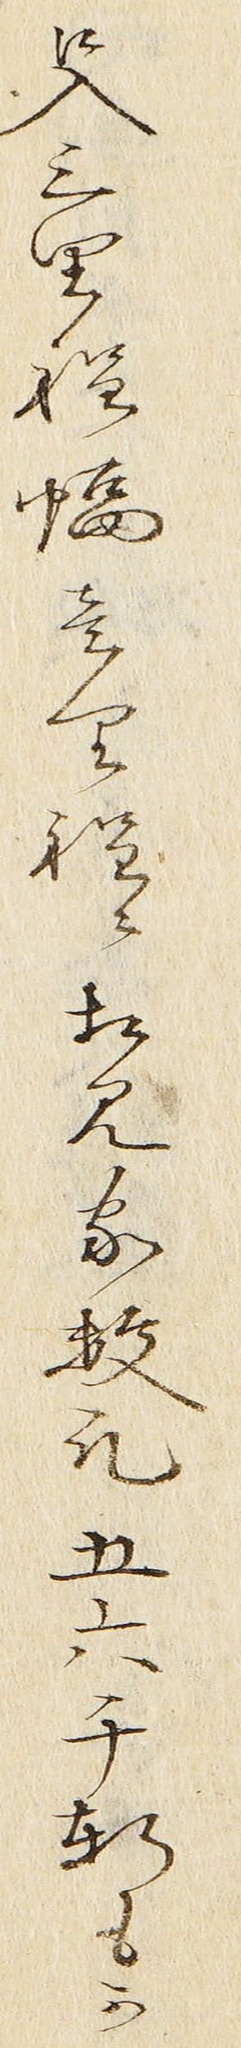口入三里程幅壱里程に相見家数凡五六千軒も可
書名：土佐中浜万次郎漂流記
